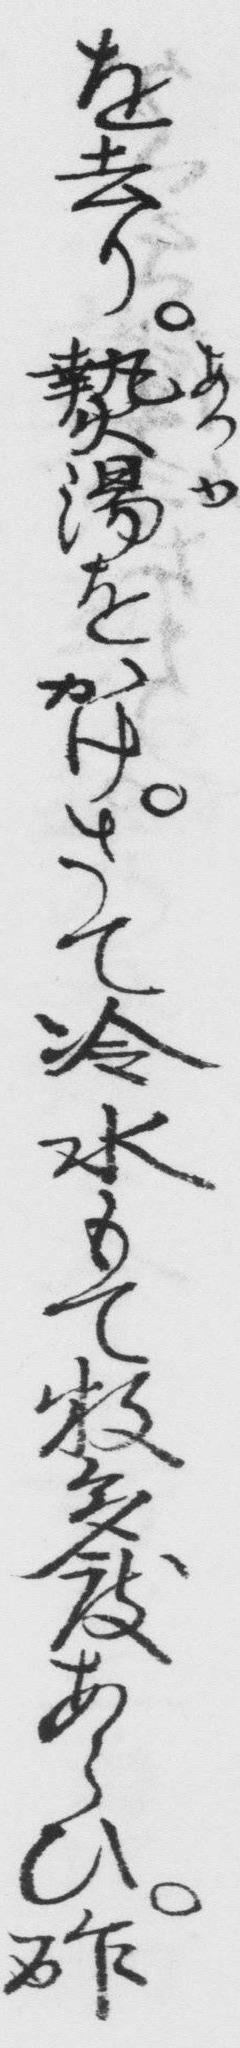を去り。熱湯をかけ。さて冷水もて数多あらひ。酢
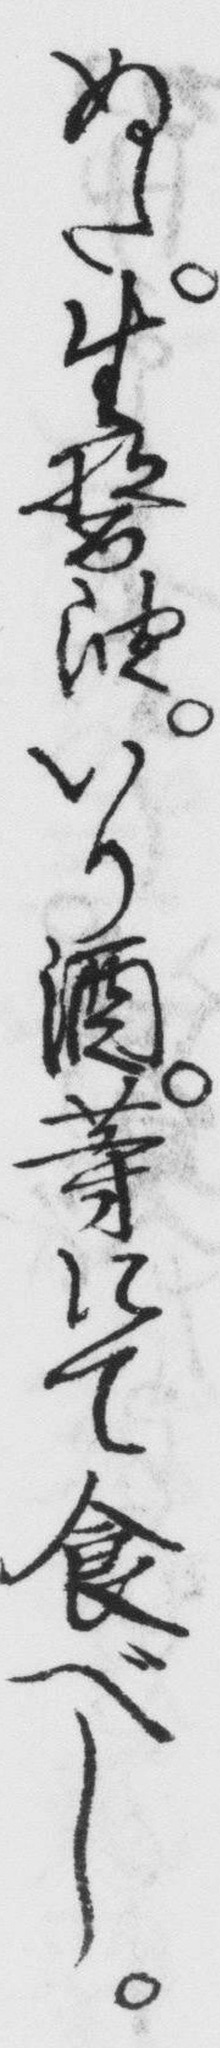ぬた。生醤油。いり酒。等にて食べし。
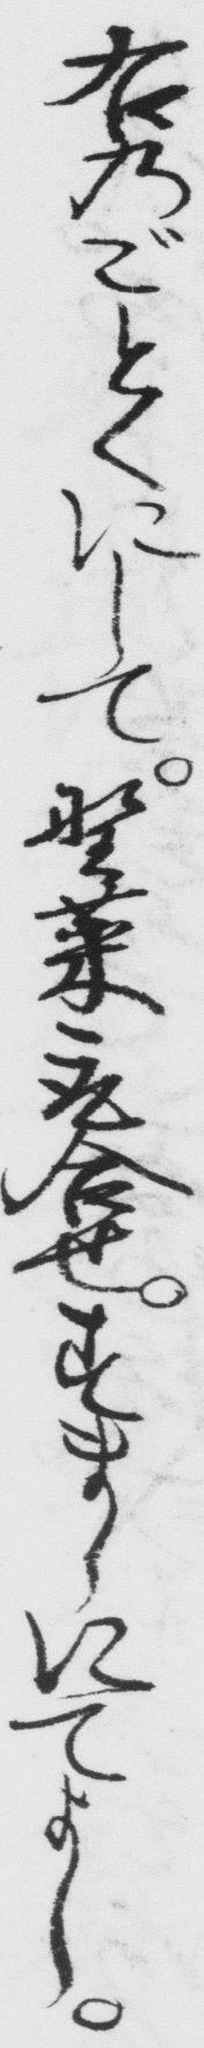右のごとくにして。野菜取合せ。すましにてよし。
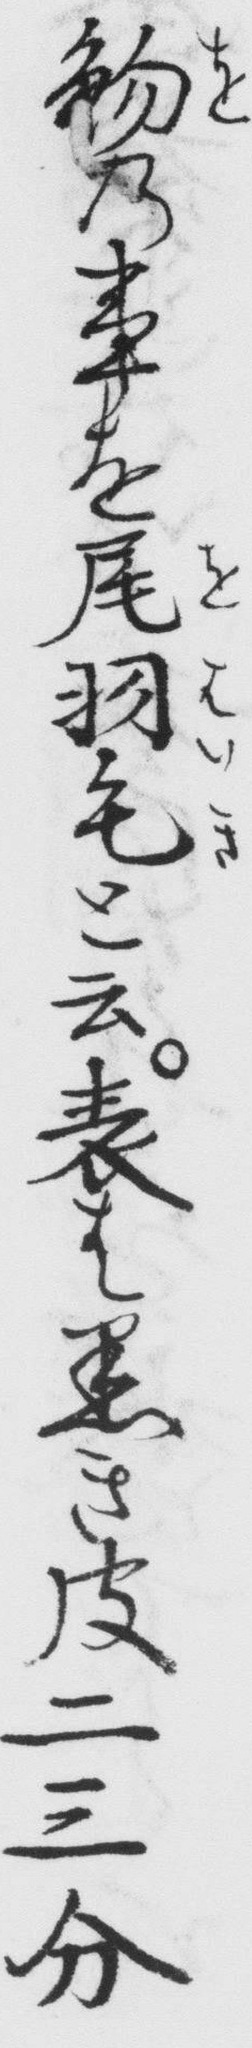テイラ魩の事を尾羽毛と云。表は黒き皮二三分
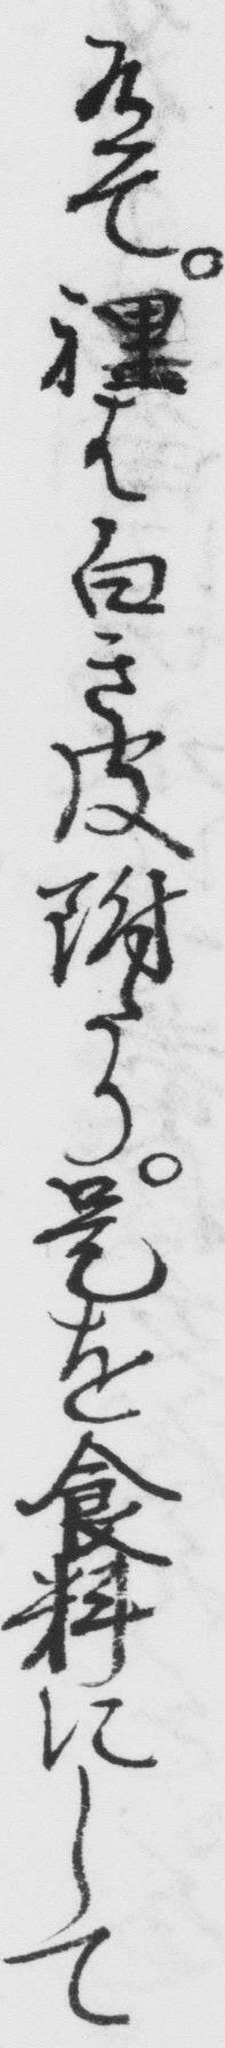有て。裡は白き皮附たり。是を食料にして
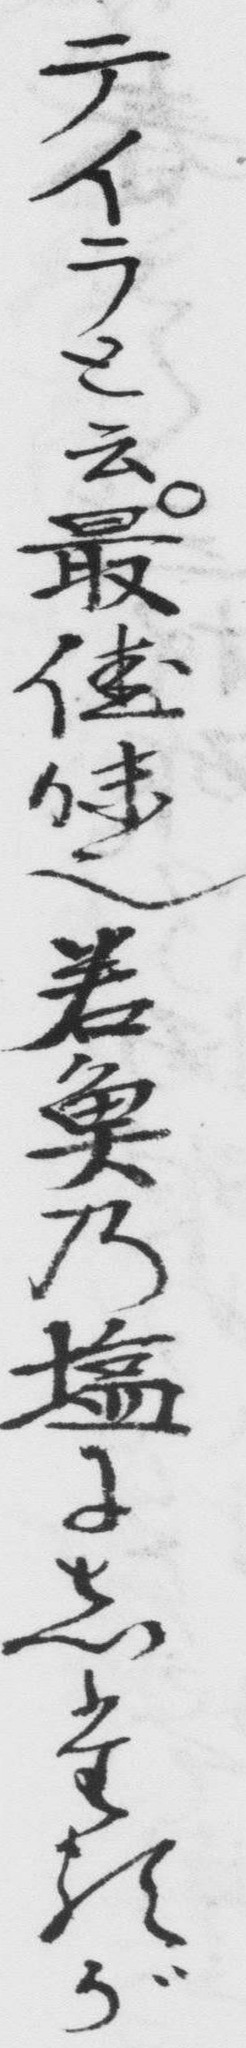テイラと云。最佳味也若魚の塩にしたるが
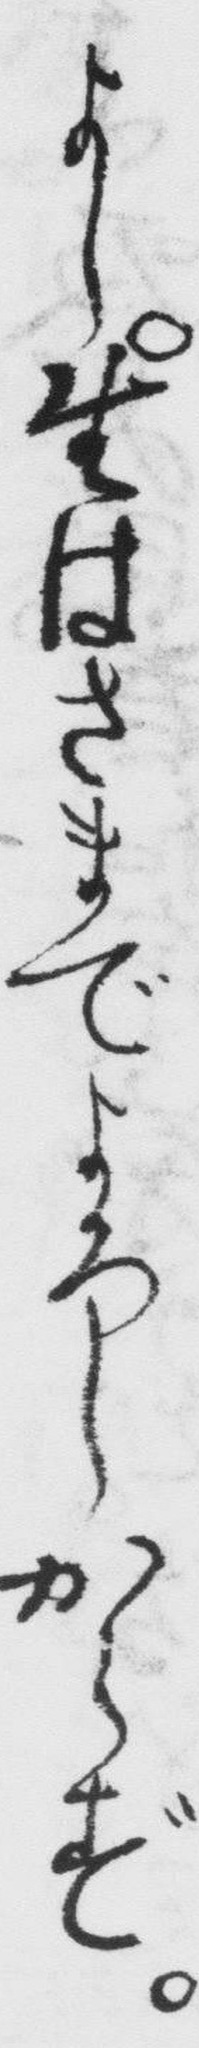よし。生はさまでよろしからず。
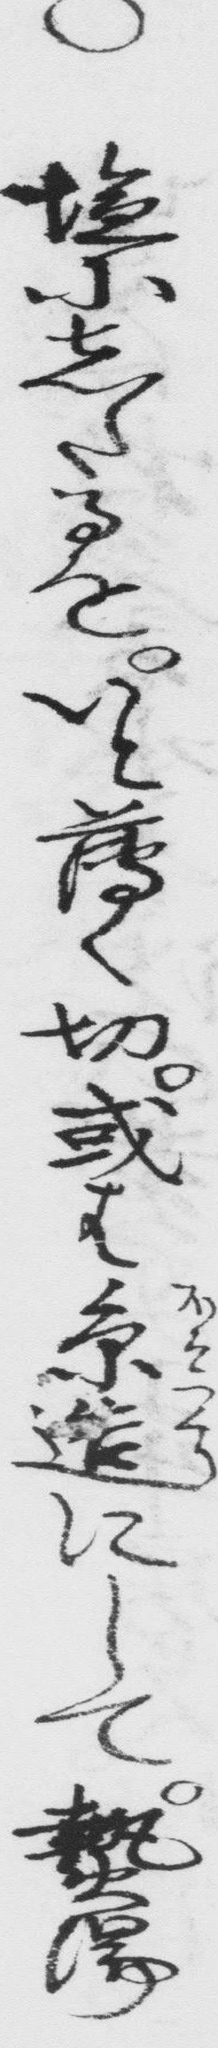○塩にしたるを。いと薄く切。或は糸造にして。熱湯

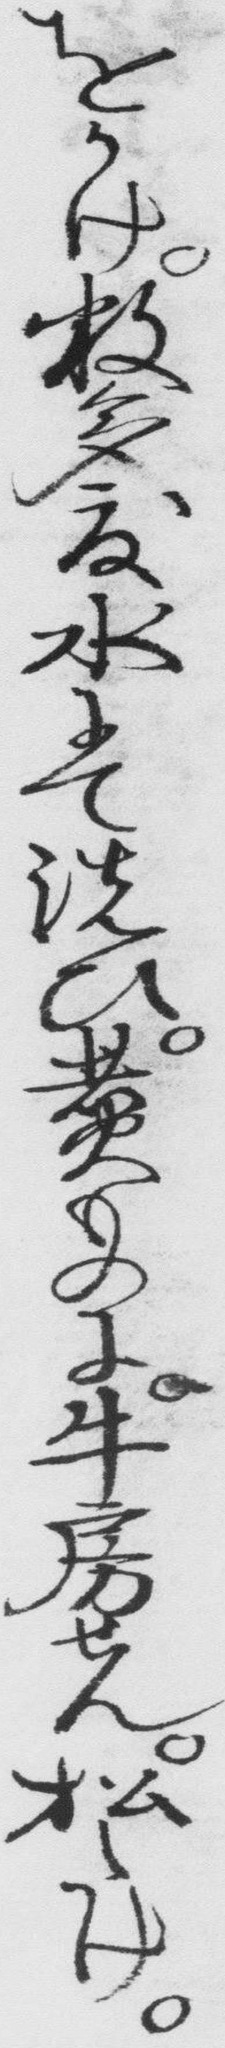をかけ。数多度水にて洗ひ。煮ものに。牛房せん。松たけ。
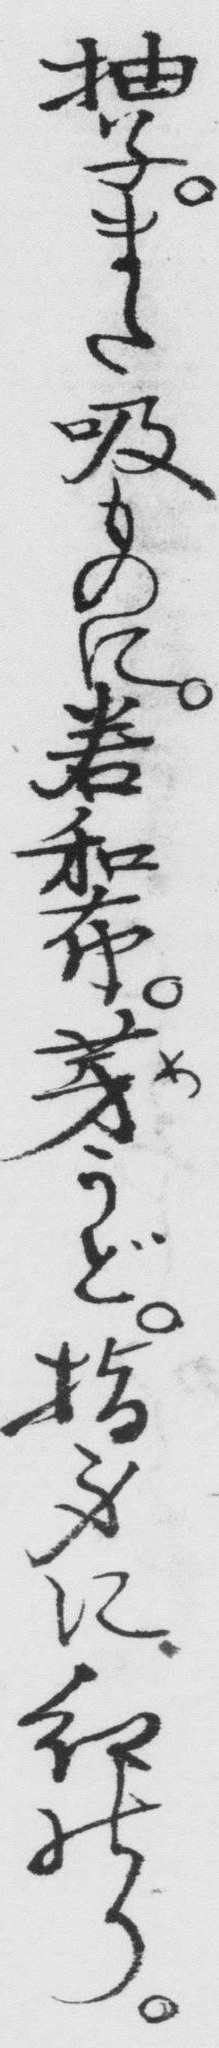柚子。また吸ものに。巻若布。芽うど。塩身に紅のり。
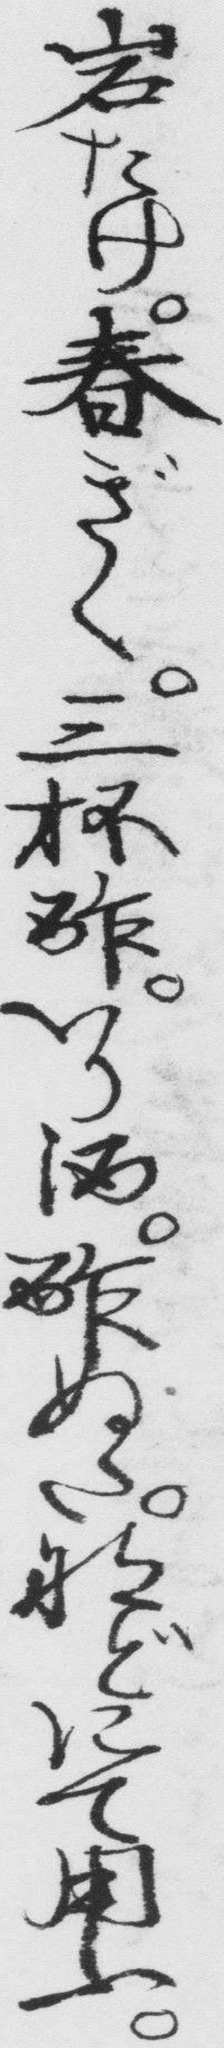岩たけ。春ぎく。三杯酢。いり酒。酢ぬた。などにて用ふ。
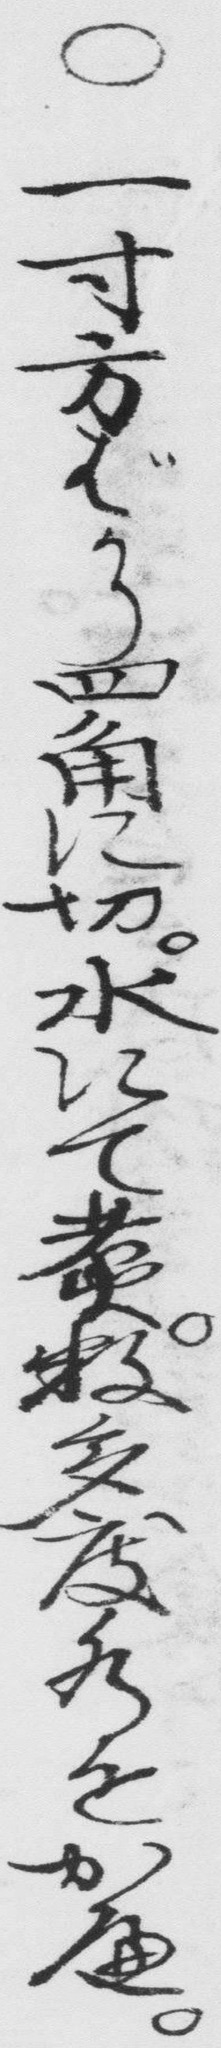○一寸方ばかり四角に切。水にて煮。数多度水をかへ。
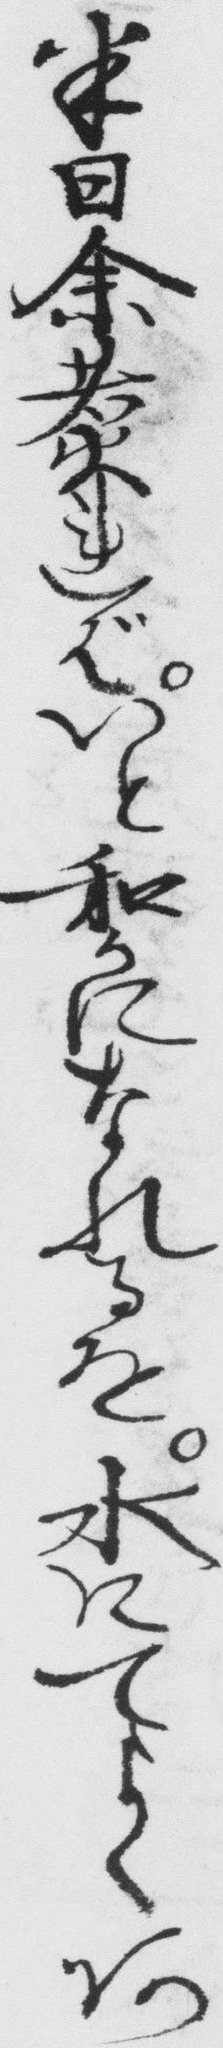半日余煮れば。いと和かになれるを。水にてよくあ
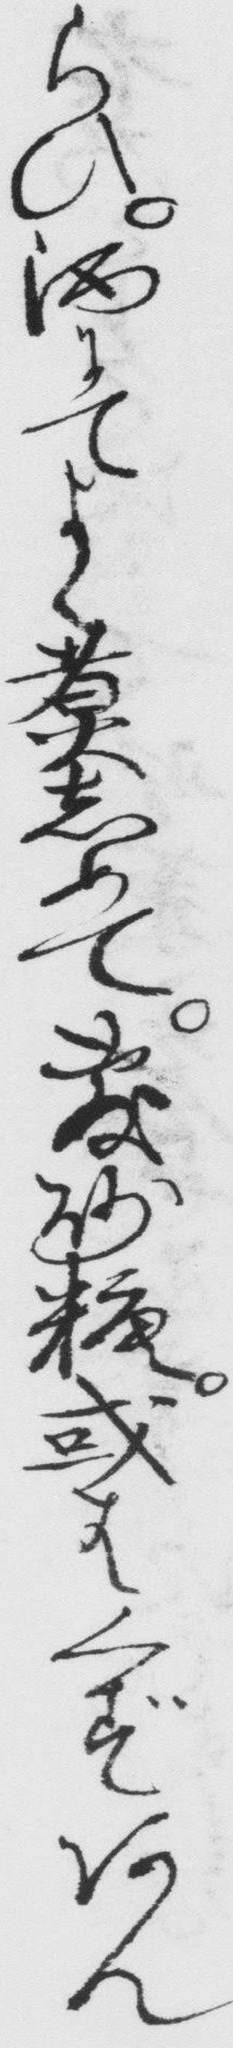らひ。酒にてよく煮しめて。敷砂糖。或はくずあん
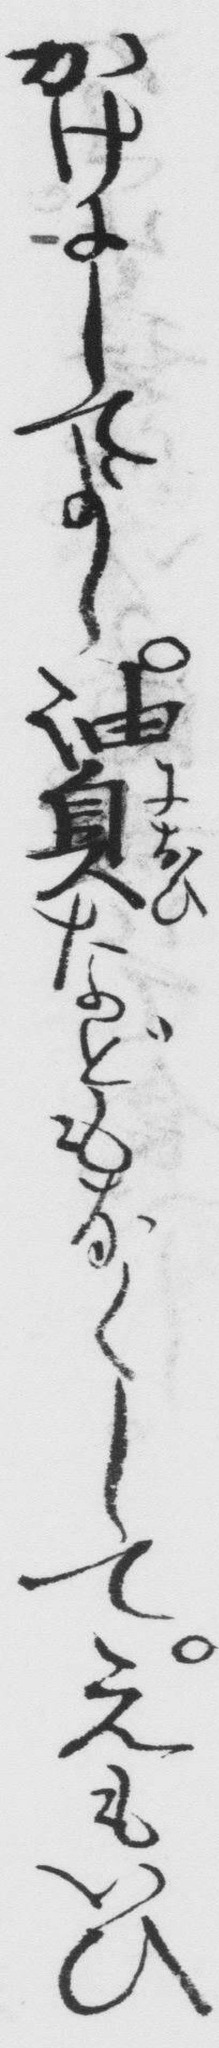かけにしてよし。油臭などもなくして。えもいひ
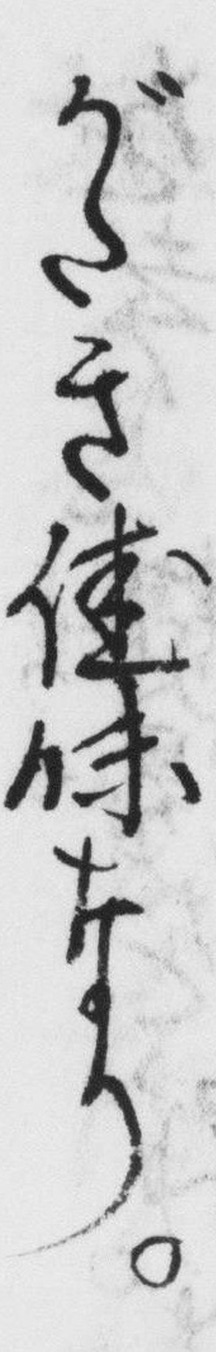がたき佳味なり。
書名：鯨肉調味方
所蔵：大阪府立大学学術情報センター 国文学研究資料館
